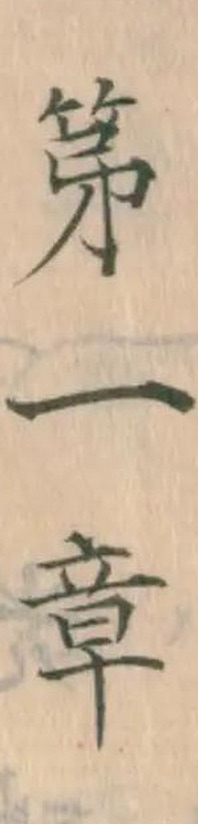第一章
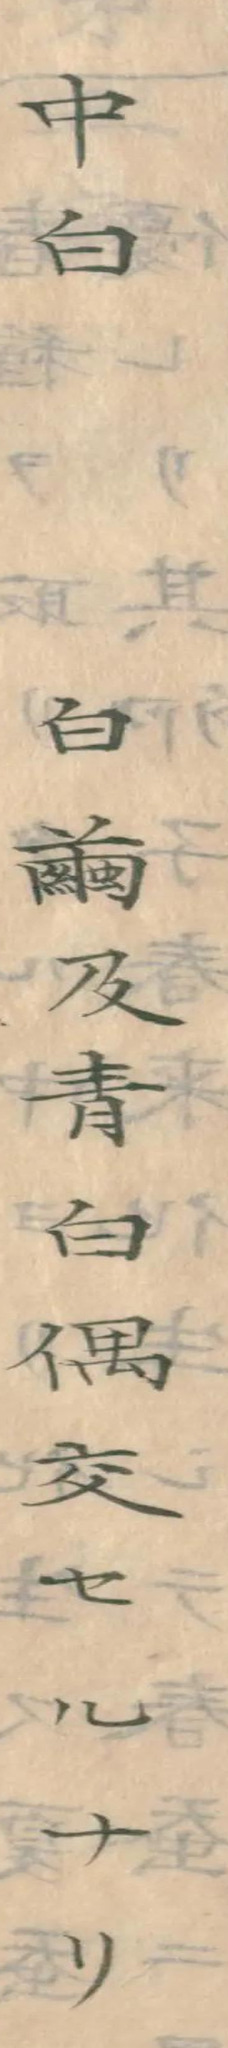┌中白白繭及青白偶交セルナリ
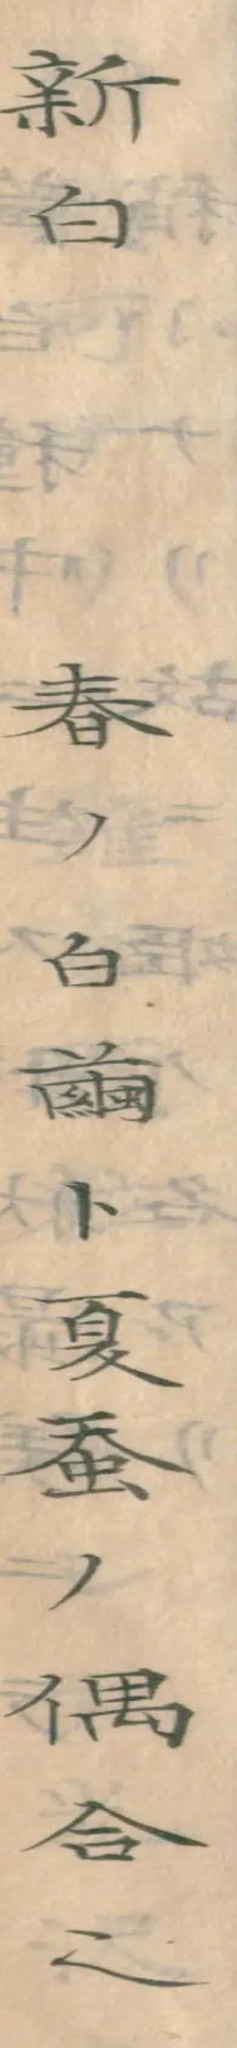└新白春ノ白繭ト夏蚕ノ偶合也

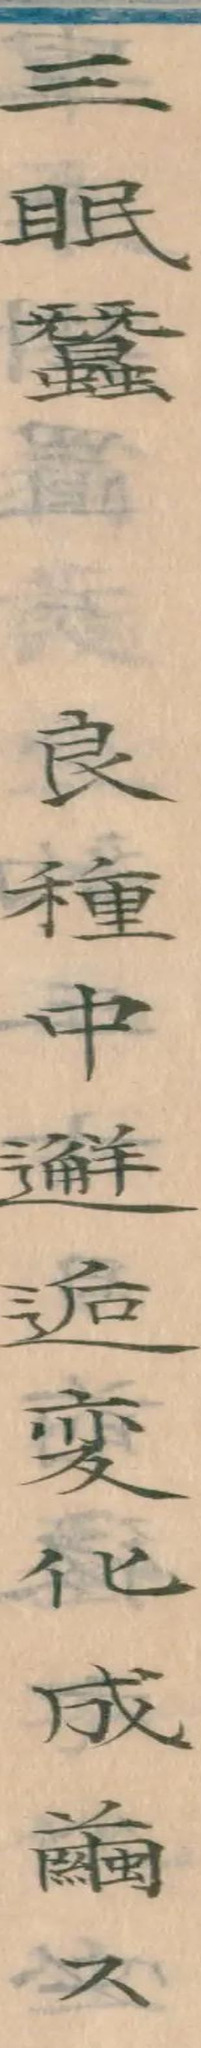三眠蚕良種中邂逅変化成繭ス
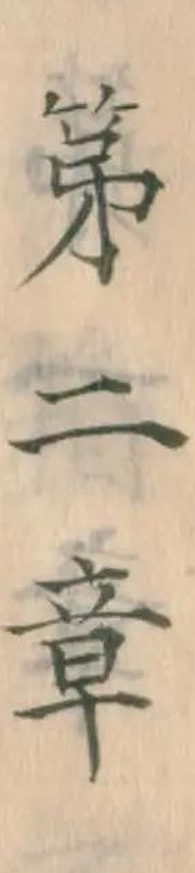第二章
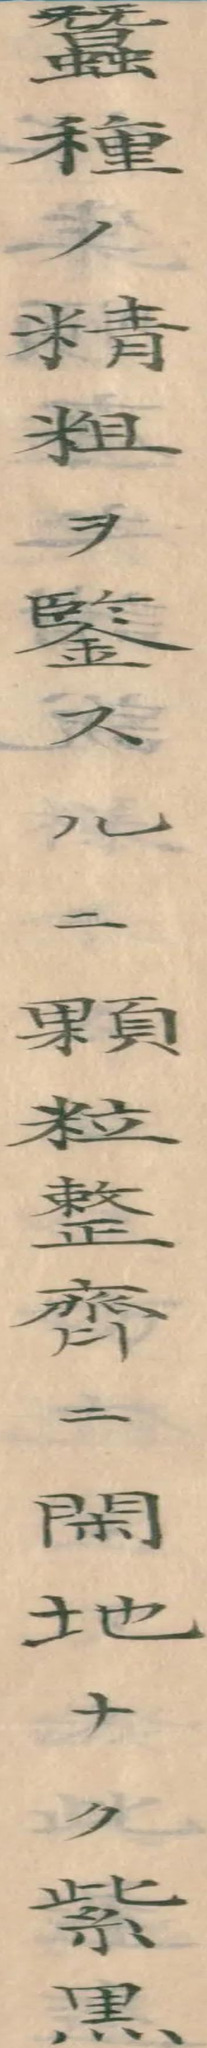蚕種ノ精粗ヲ鍳スルニ顆粒整斉ニ閑地ナク紫黒
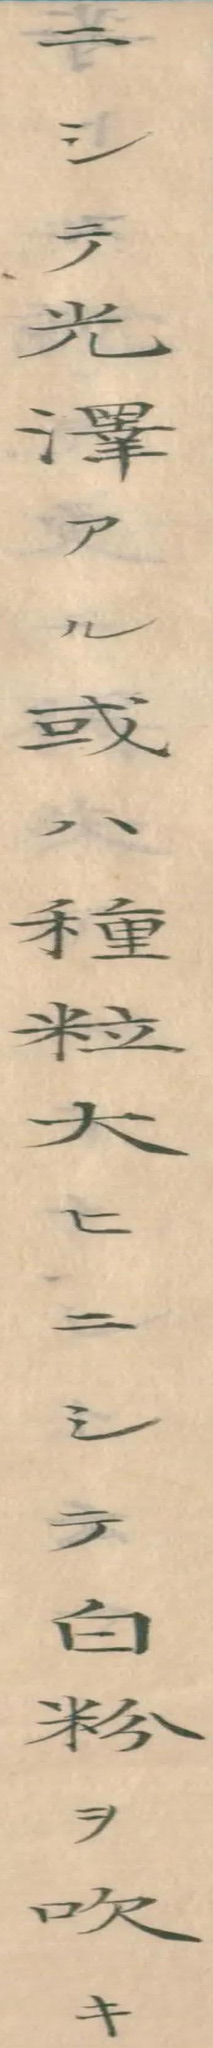ニシテ光沢アル或ハ種粒大ヒニシテ白粉ヲ吹キ
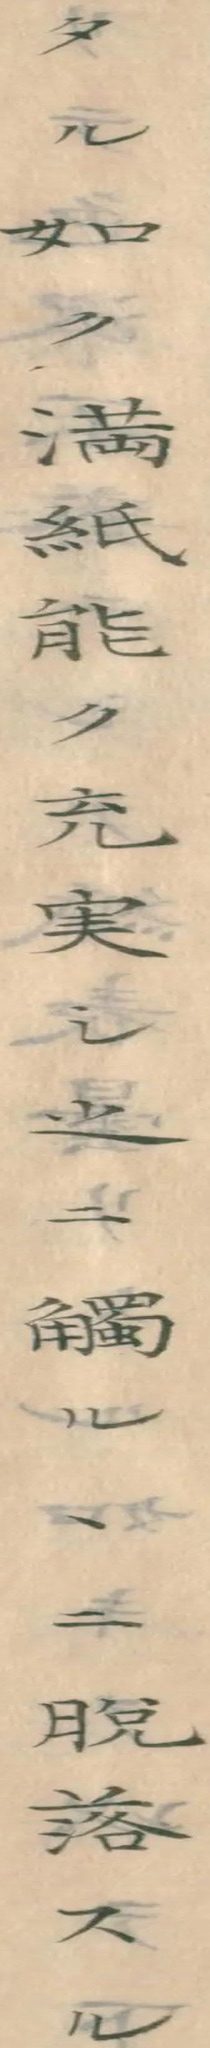タル如ク満紙能ク充実シ之ニ触ルヽニ脱落スル
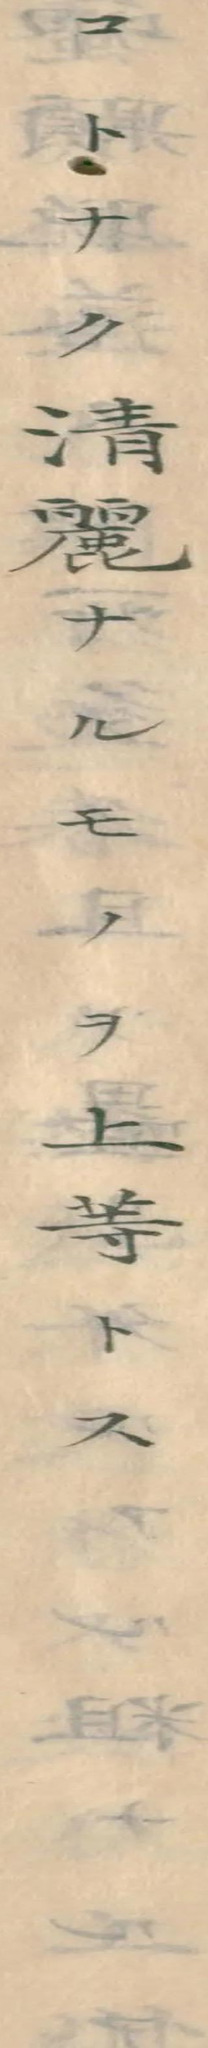コトナク清麗ナルモノヲ上等トス
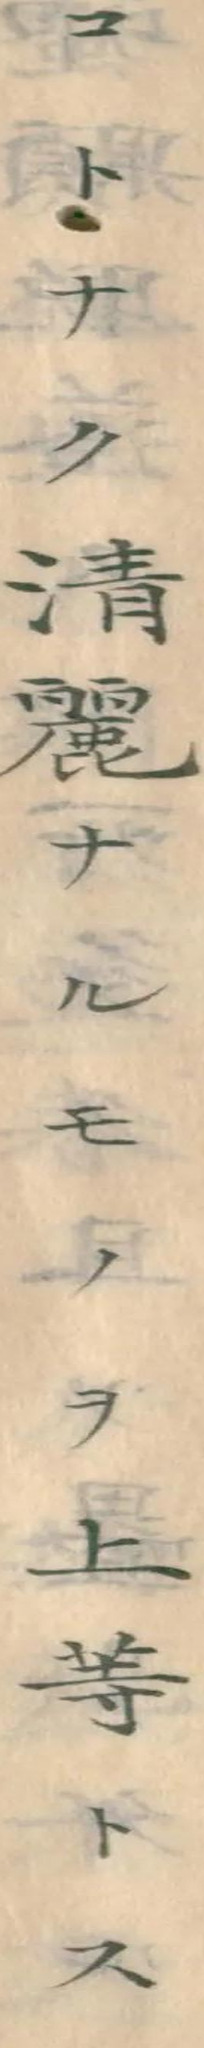コトナク清麗ナルモノヲ上等トス
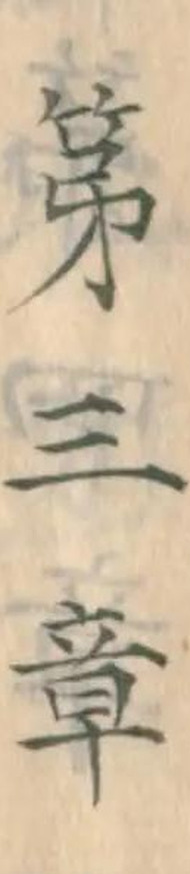第三章
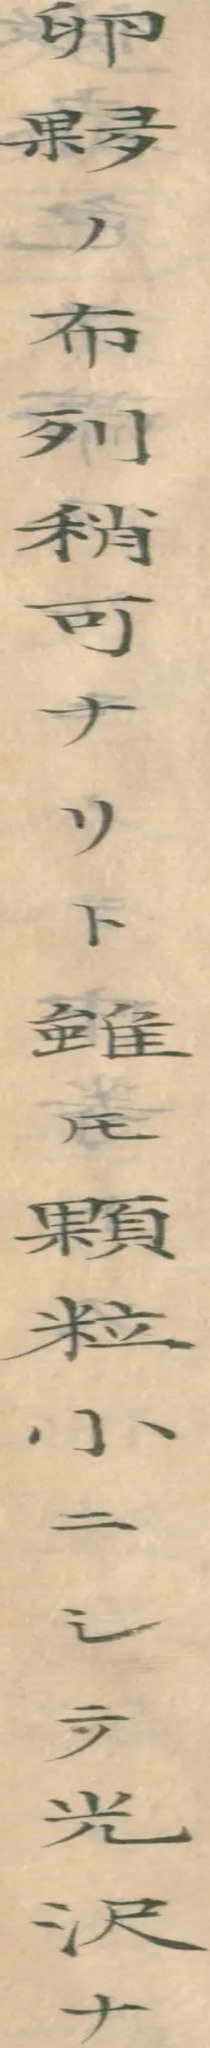卵ノ布列稍可ナリト雖トモ顆粒小ニシテ光沢ナ

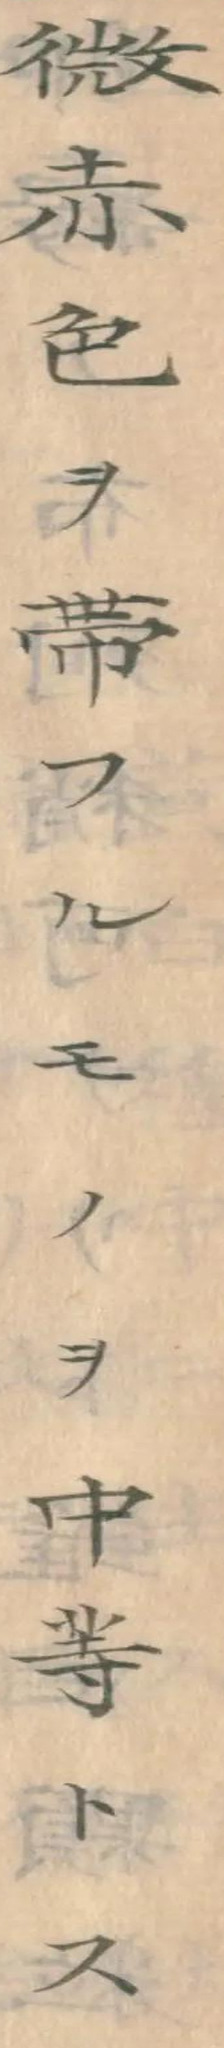微赤色ヲ帯フルモノヲ中等トス
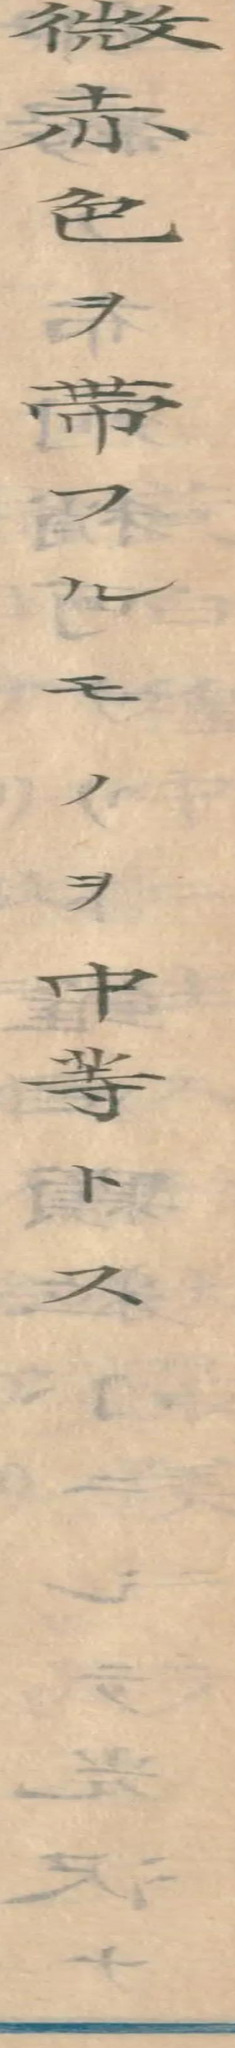微赤色ヲ帯フルモノヲ中等トス
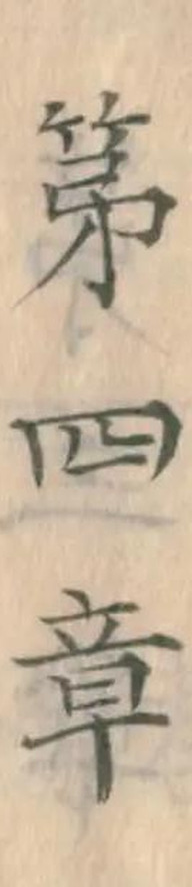第四章
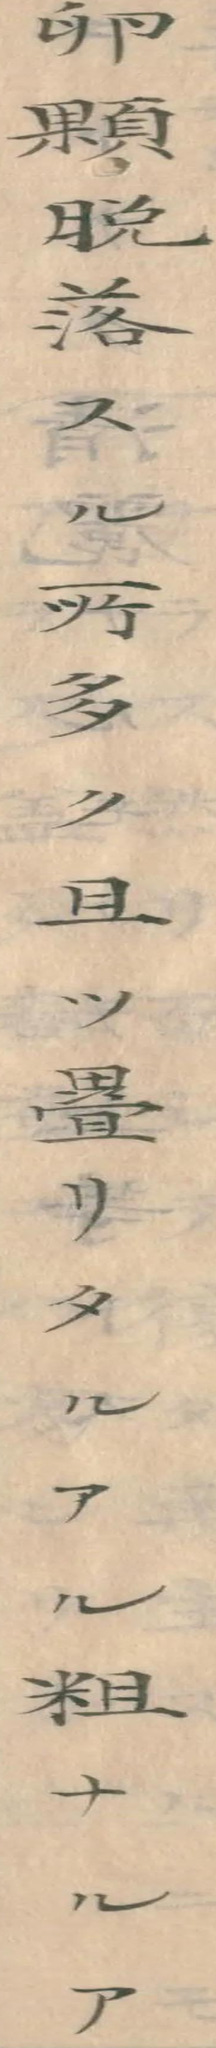卵顆脱落スル所多ク且ツ畳リタルアル粗ナルア
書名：蚕桑集成
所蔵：国立国会図書館 National Diet Library, JAPAN
